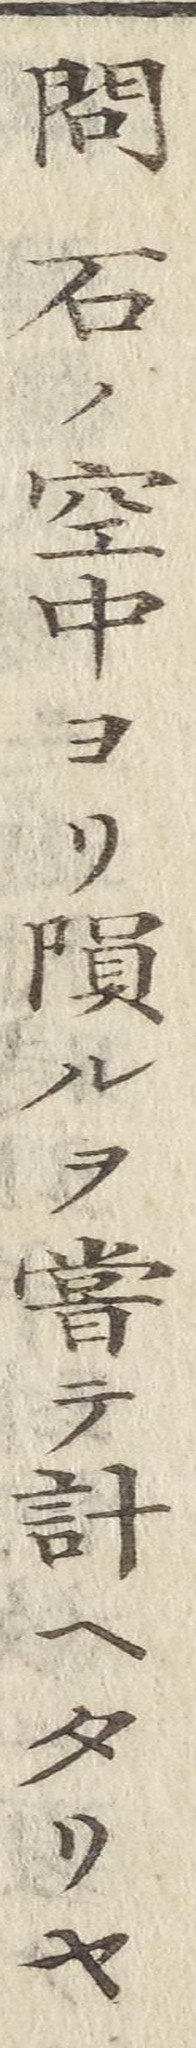問石ノ空中ヨリ隕ルヲ嘗テ計ヘタリヤ
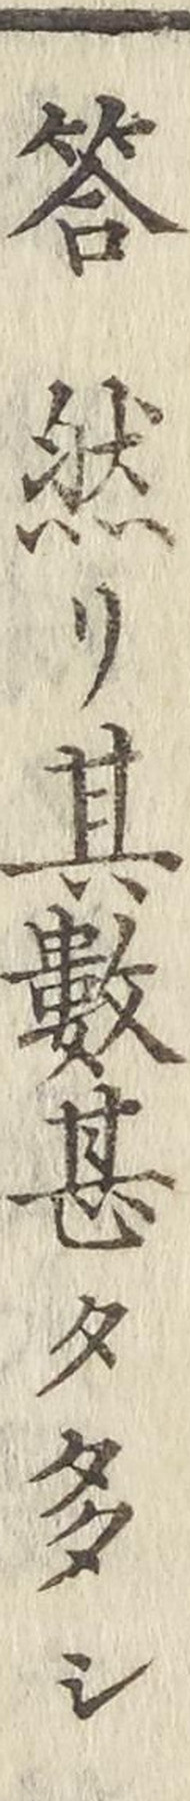答然リ其数甚タ多シ
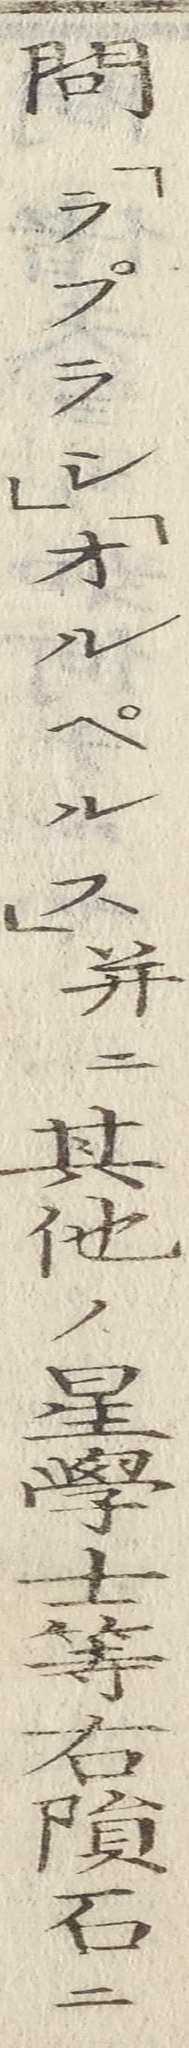問「ラプラシ」「オルペルス」幷ニ其他ノ星学士等右隕石ニ
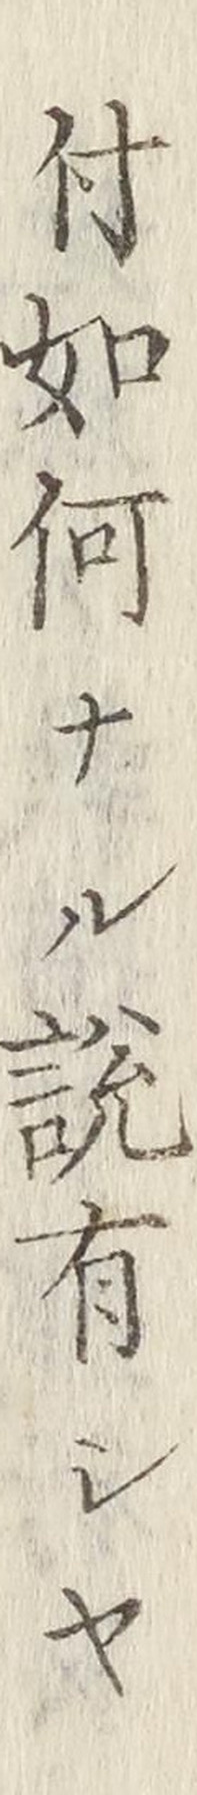付如何ナル説有シヤ
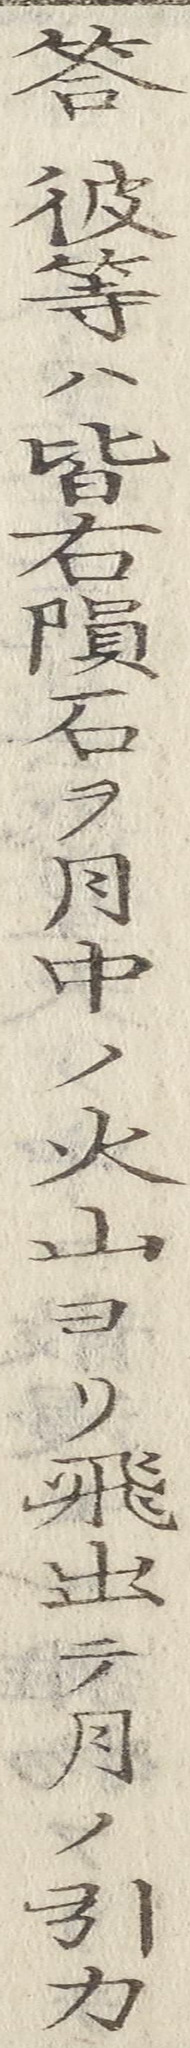答彼等ハ皆右隕石ヲ月中ノ火山ヨリ飛出テ月ノ引力
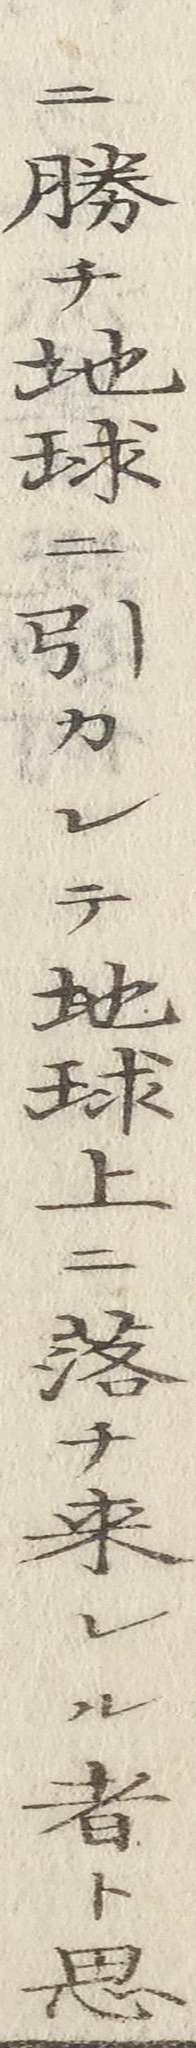ニ勝チ地球ニ引カレテ地球上ニ落チ来レル者ト思
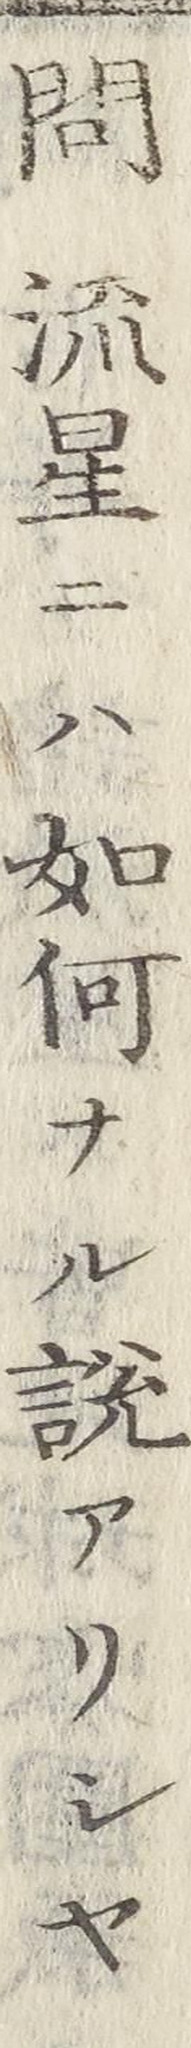問流星ニハ如何ナル説アリシヤ
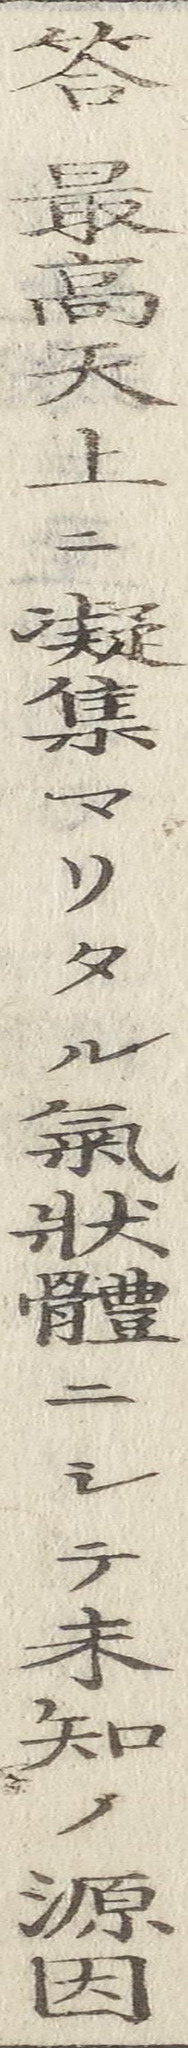答最高天上ニ凝集マリタル気状体ニシテ未知ノ源因
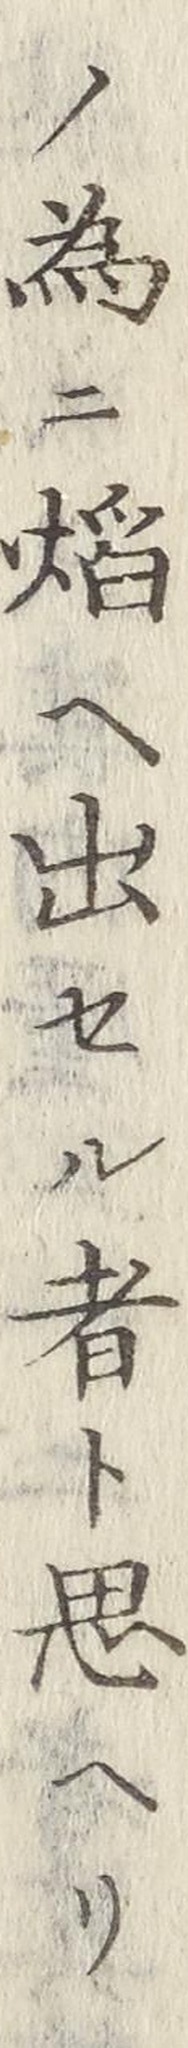ノ為ニ焔ヘ出セル者ト思ヘリ
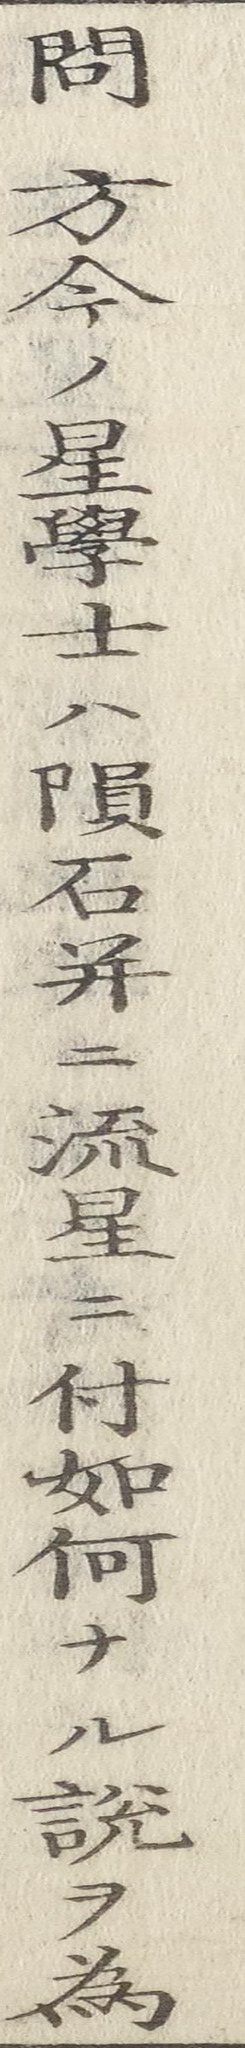問方今ノ星学士ハ隕石幷ニ流星ニ付如何ナル説ヲ為

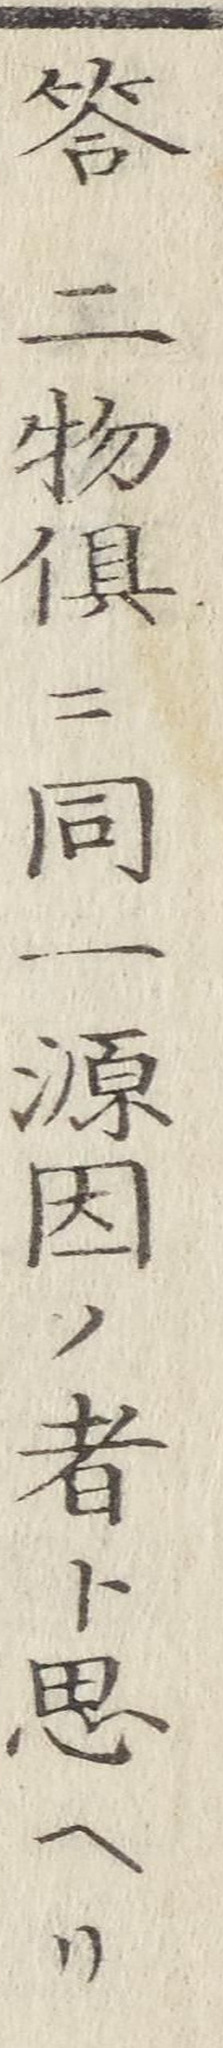答二物倶ニ同一源因ノ者ト思ヘリ
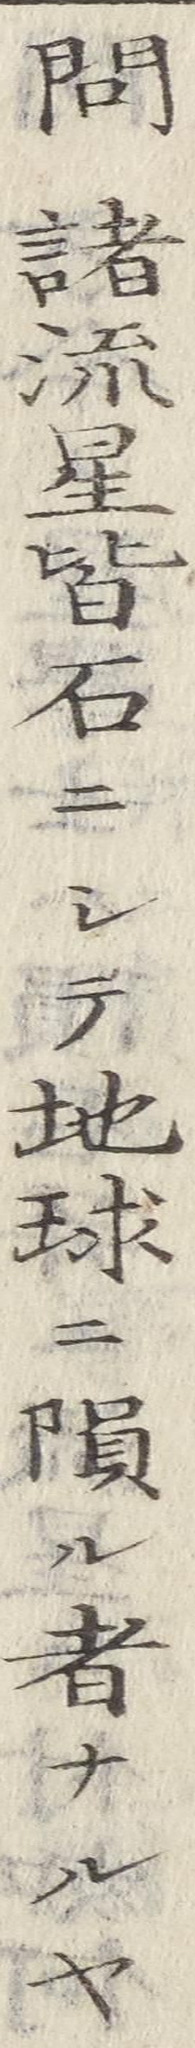問諸流星皆石ニシテ地球ニ隕ル者ナルヤ
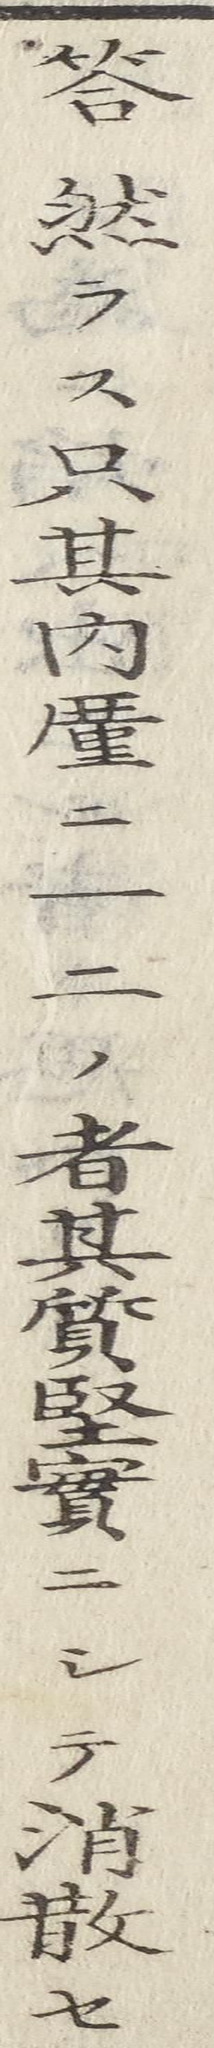答然ラズ只其内僅ニ一二ノ者其質堅実ニシテ消散セ
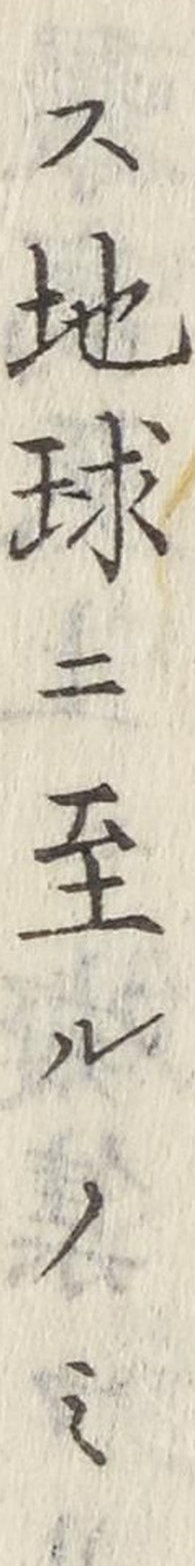ス地球ニ至ルノミ
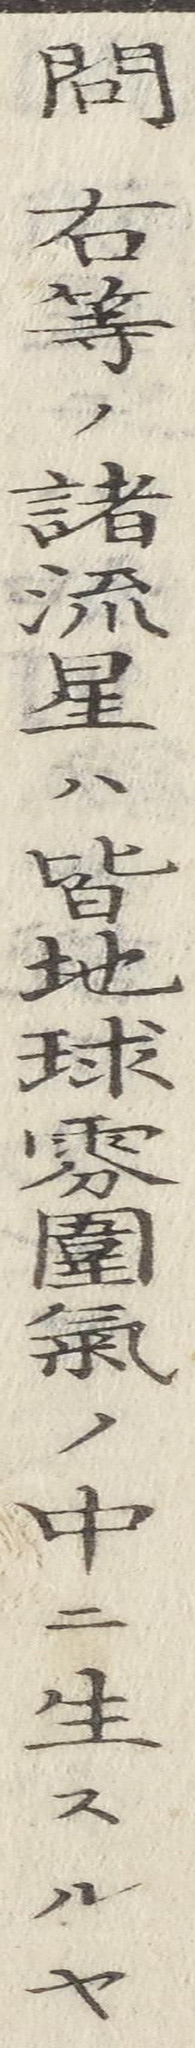問右等ノ諸流星ハ皆地球雰囲気ノ中ニ生スルヤ
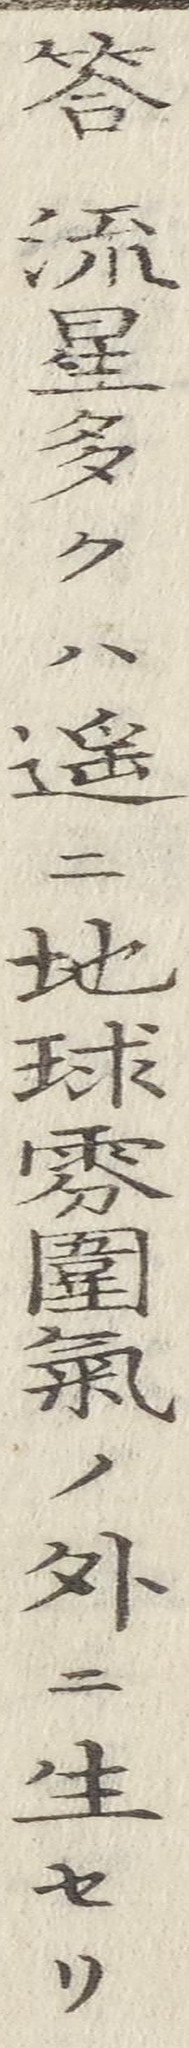答流星多クハ遥ニ地球雰囲気ノ外ニ生セリ
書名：星学圖説　上
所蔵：東京大学地震研究所図書室 Earthquake Research Institute Library, The University of Tokyo, JAPAN
